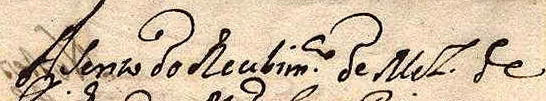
Asento do Recebim.to de MeL. de
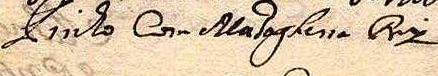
Pinho Com Madaglena Frz̄
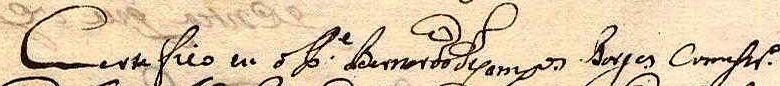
Certefico eu o P.e Bernardo de Campos Borges Comissr.o
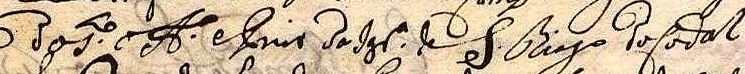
do s.to off.o e Prior da Igr.a de S. Thiago do Codal
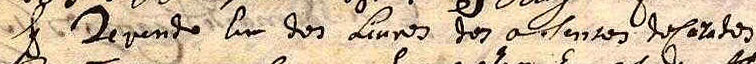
q̄ Revendo hum dos Liuros dos asentos do Cazados
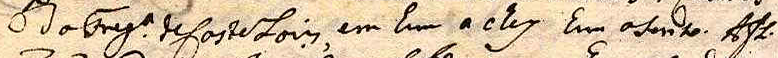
da Freg.a de CasteLoins em hum achey hum asento. A fl.
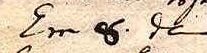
Em 8. de
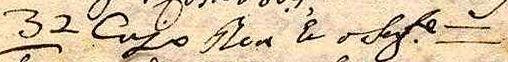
32 Cujo theor he o Seg.te =
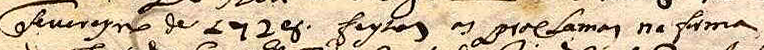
Feuereyro de 1728. feytas as procLamas na forma
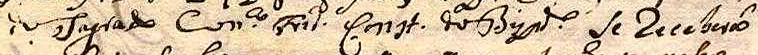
do sagrado Con.co Trid. Const. do Bispd.o se Receberaõ
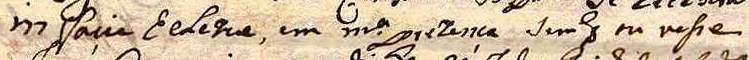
in facie EcLeziæ, em m.a prezença sem q̄ ouvesse
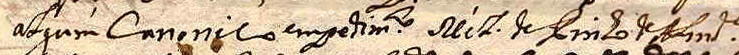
aLgum Canonico empedim.to MeL. de Pinho de Almd.a
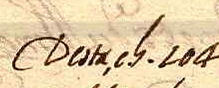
Desta, e b. 104
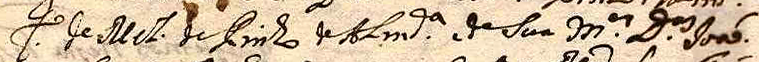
f.o de Mel. de Pinho de Almd.a e de Sua m.er D.as Ioaõ.
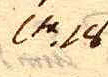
Cta. 18
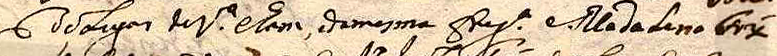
do Lugar de V.a cham, da mesma freg.a e MadaLena Frx̄
